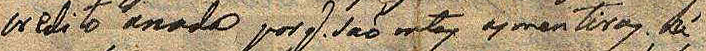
credito a nada porq̄ saõ estas as mentiras hé
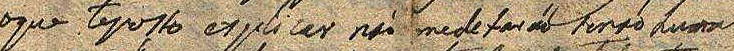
o que te posso explicar naõ me dexaraõ senaõ huma
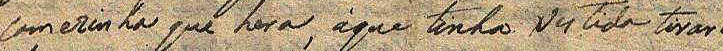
camezinha que hera, á que tenho vestida tirar
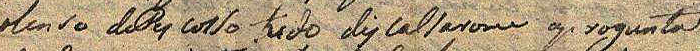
o lenso de Pescosso tudo discalsarome a progunta
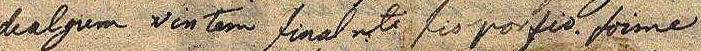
de algum vintem finalm.te fio por fio. foime
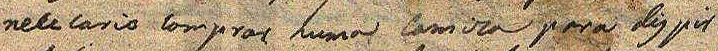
nececario comprar huma camiza para dispir
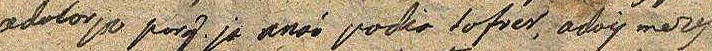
a do corpo porq̄ ja a naõ podia sofrer, a dois mezes
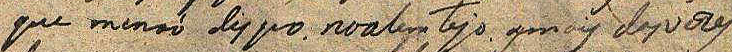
que me naõ dispo. no alemtejo as mais das vezes
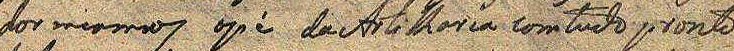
dormimos o pé da Artilharia com tudo pronto
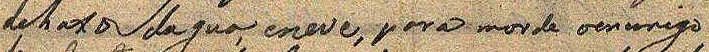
debaxo dagua, e neve, pora mor de o enemigo
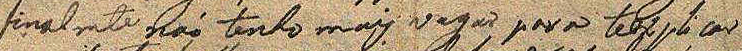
finalmte naõ tenho mais vagar para te explicar
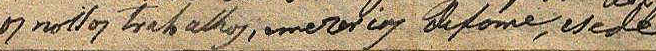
os nossos trabalhos, e mezerias de fome, e sede
